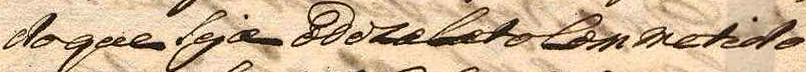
do que seja o dezaCato Commetido
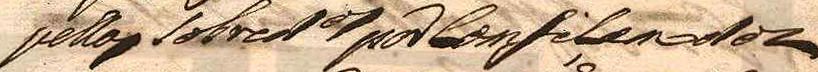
pellos sobredos por ComfiÇam doz
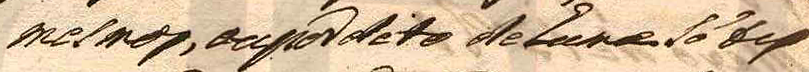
mesmos, ou por dito de huma só tes
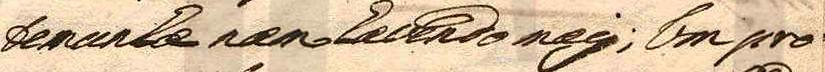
temunha nam havendo mais; vm pro
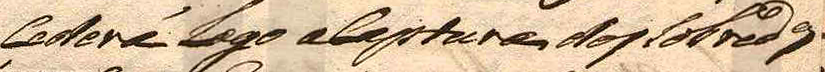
çederá Logo a captura dos sobredos
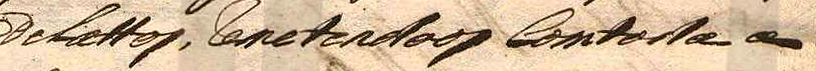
DeLattos, Remetendoos Com toda a
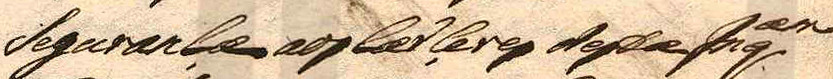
seguranÇa aos CarÇeres desta Jnqam
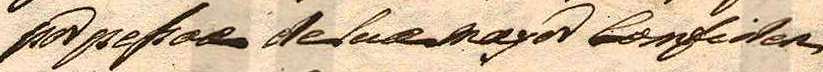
por pessoa de sua mayor Comfiden
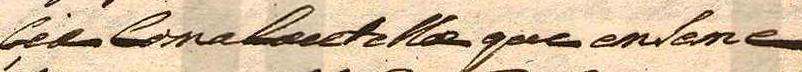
çia com a Cautella que em seme
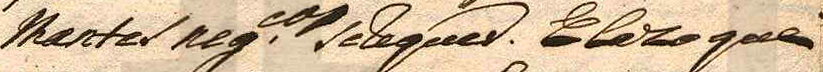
lhantes negços se Requer. E Cazo que
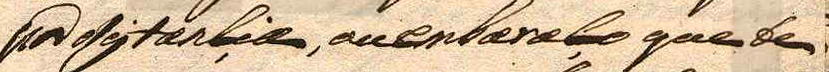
por distanÇia, ou embaraÇo que te
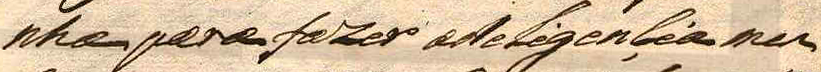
nha para fazer a deLigenÇia men
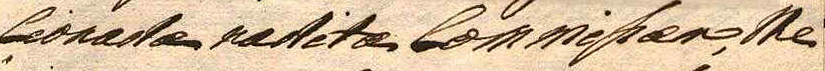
çionada na dita Commissam, lhe
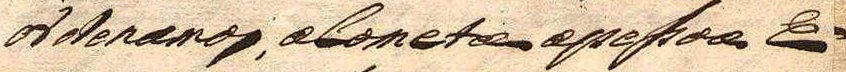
ordenamos, o Cometa a pessoa E
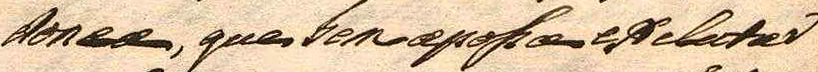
donea, que bem a possa exeCutar
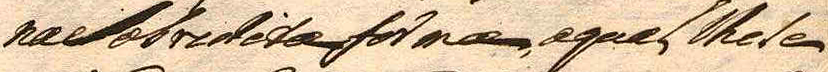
na Sobredita forma, a qual, lhe se
